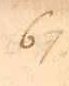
67
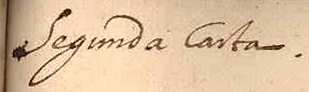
Segunda Carta
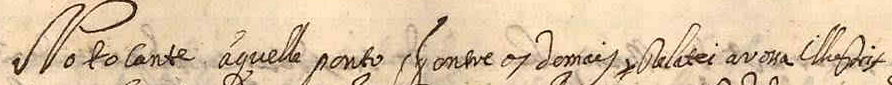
No tocante áquelle ponto (q̄ entre os demais Relatei a vosa Illustris
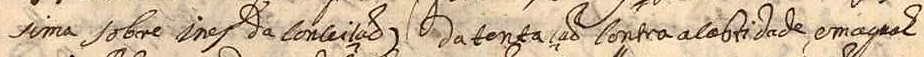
sima sobre ines da Conceiçaõ) da tentaçaõ Contra a castidade, em a qual
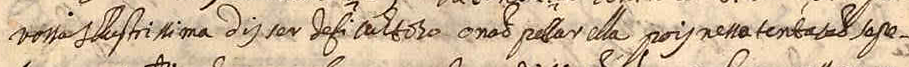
vossa Illustrissima diz ser deficultozo o naõ pasar ella, pois nessa tentaçaõ se pe
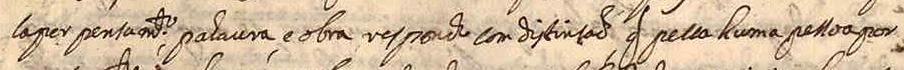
ca per pensam.to, palaura, e obra respondo com distinsaõ, q̄ pecca huma pessoa por
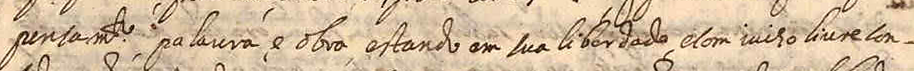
pensam.to, palaura, e obra estando em sua liberdade, e com iuizo liure con
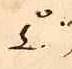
1.o
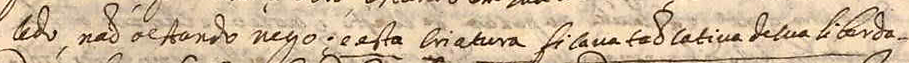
cedo, naõ o estando nego; e esta criatura ficaua taõ catiua de sua liberda
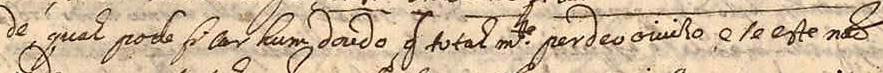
de qual pode ficar hum doudo q̄ totalm.te perdeo o iuizo, e se este não
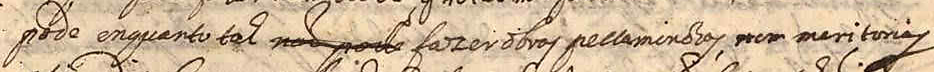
pode enquanto tal não pode fazer obras peccaminozas, nem meritorias
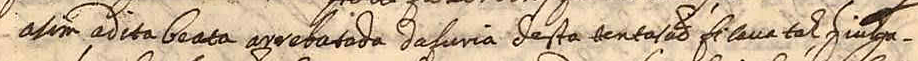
asim a dita beata arrebatada da furia desta tentasaõ ficaua tal q̄ iulga
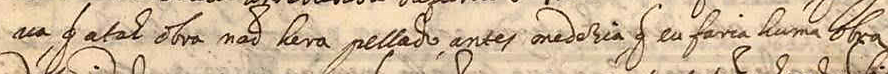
ua q̄ a tal obra naõ hera peccado, antes me dezia q̄ eu faria huma obra
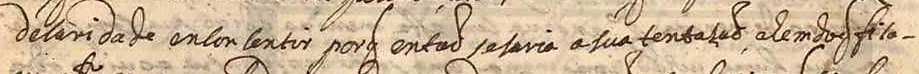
de caridade en concentir, porq̄ entaõ sesaria a sua tentaçaõ, alem do q̄ fica
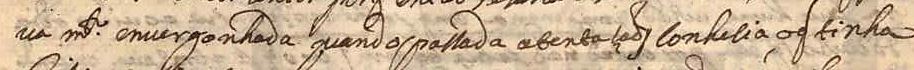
ua m.to enuergonhada quando passada a tentaçaõ conhecia, o q̄ tinha
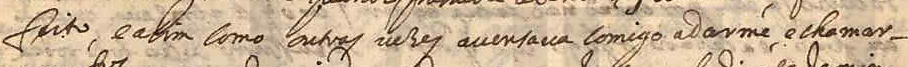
feito, e asim como outras uezes auersaua comigo a darme, e chamar
